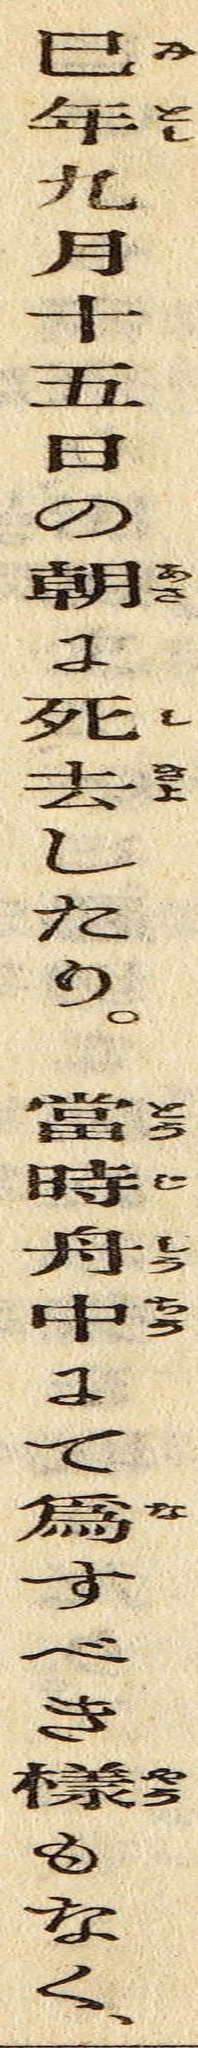巳年九月十五日の朝に死去したり。当時舟中にて為すべき様もなく、
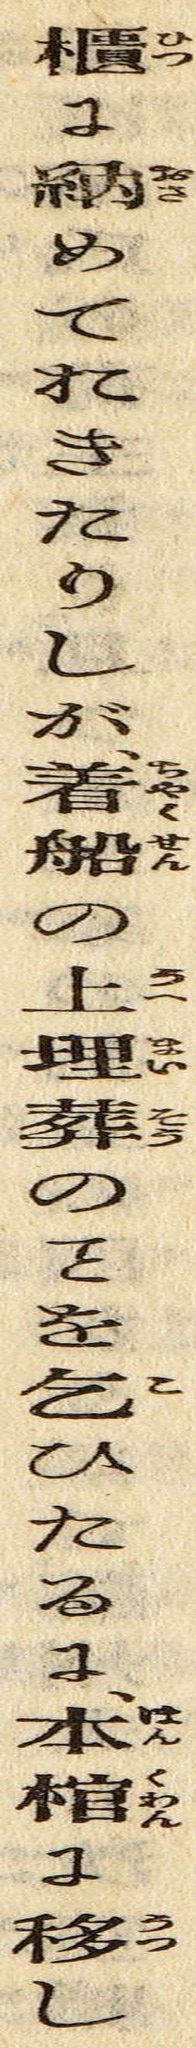櫃に納めておきたりしが、着船の上埋葬のことを乞ひたるに、本棺に移し
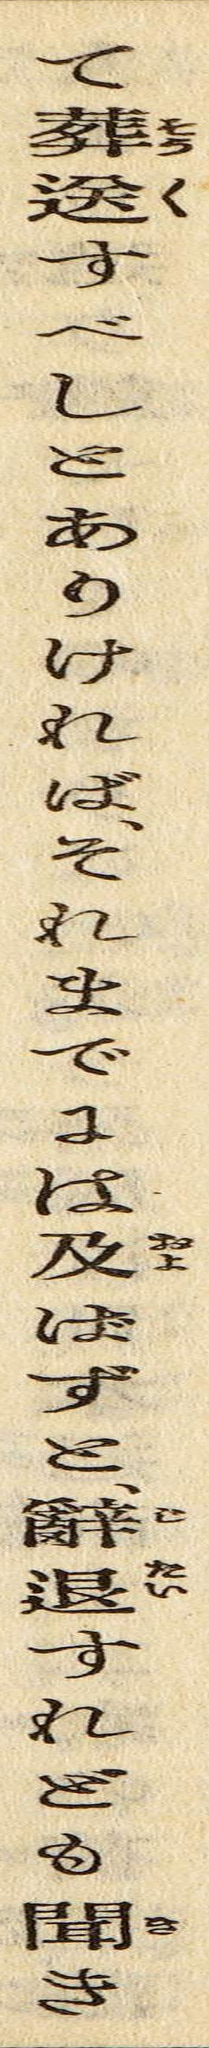て葬送すべしとありければ、それまでには及ばずと辞退すれども聞き
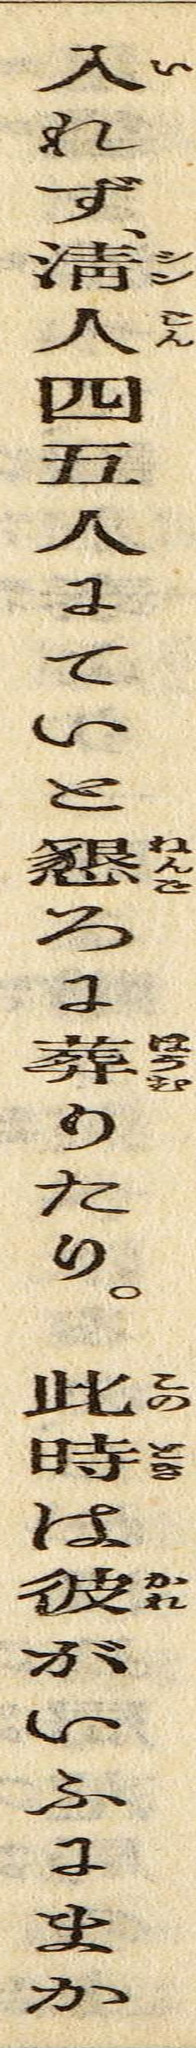入れず、清人四五人にていと懇ろに葬りたり。此時は彼がいふにまか
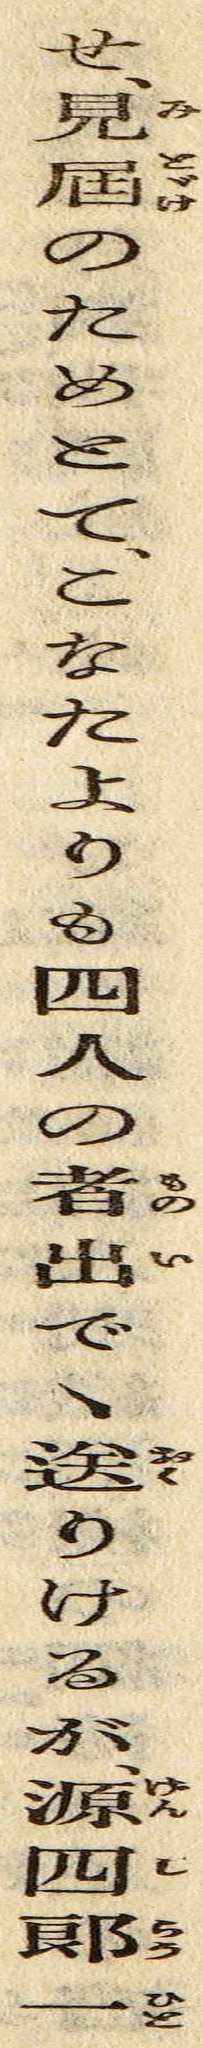せ、見届のためとて、こなたよりも四人の者出でヽ送りけるが、源四郎一
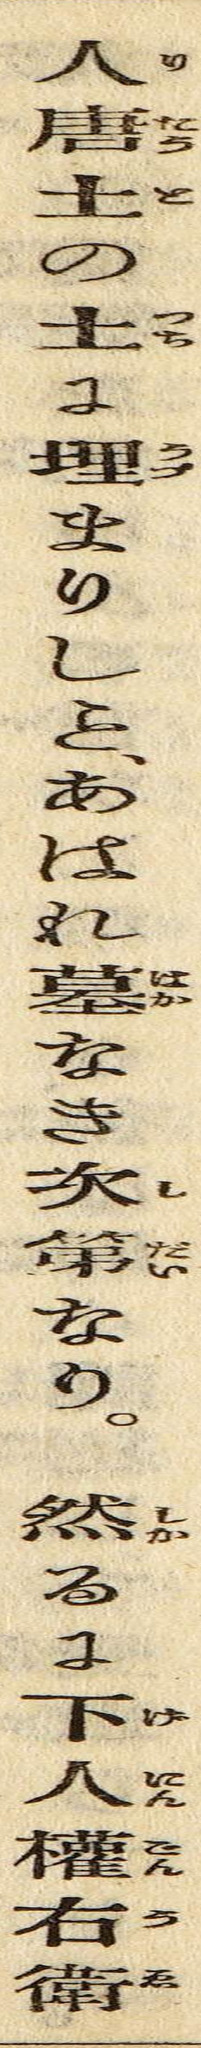人唐土の土に埋まりしこと、あはれ墓なき次第なり。然るに下人権右衛
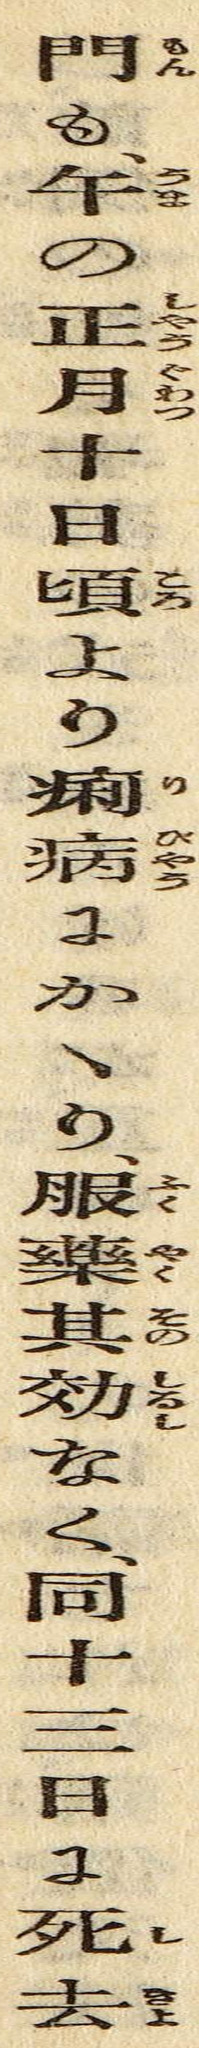門も午の正月十日頃より痢病にかゝり服薬其効なく、同十三日に死去

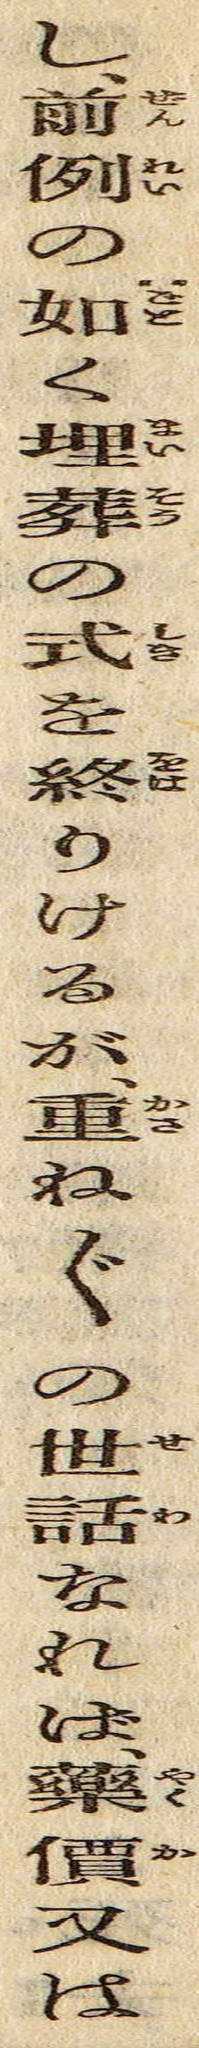し、前例の如く埋葬の式を終りけるが重ね〳〵の世話なれば薬価又は
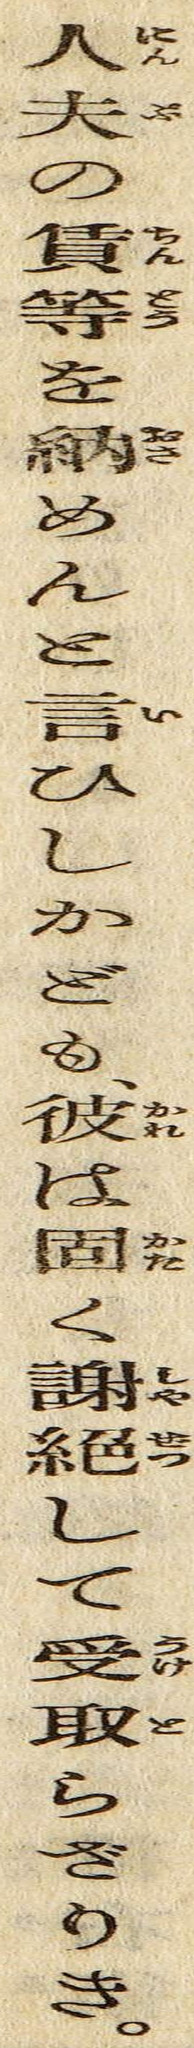人夫の賃等を納めんと言ひしかども彼は固く謝絶して受取らざりき。
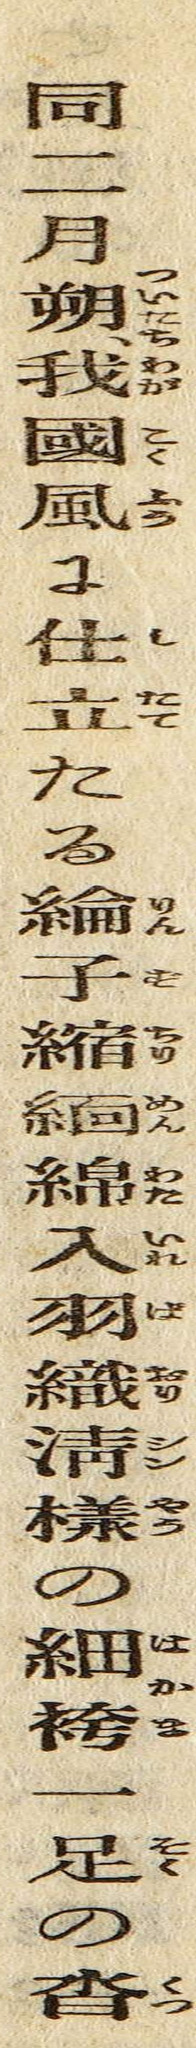同二月朔、我国風に仕立たる綸子縮緬綿入羽織清様の細袴一足の沓
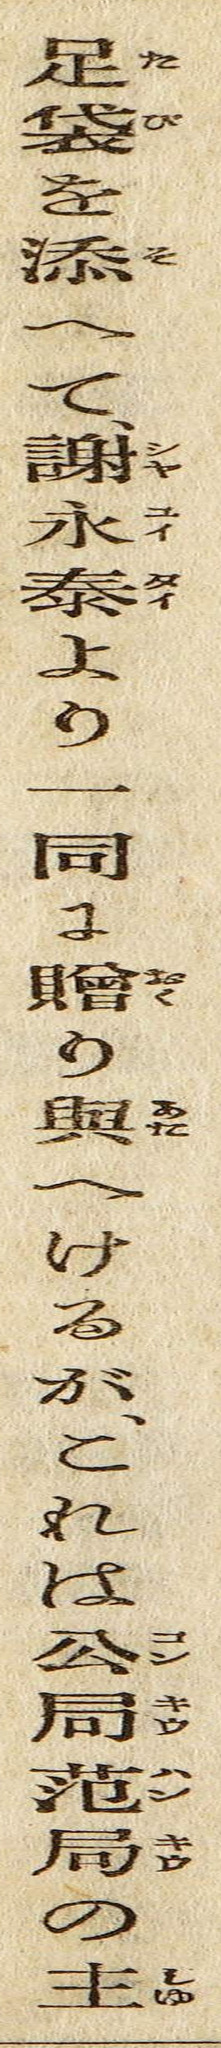足袋を添へて謝永泰より一同に贈り与へけるが、これは公局范局の主
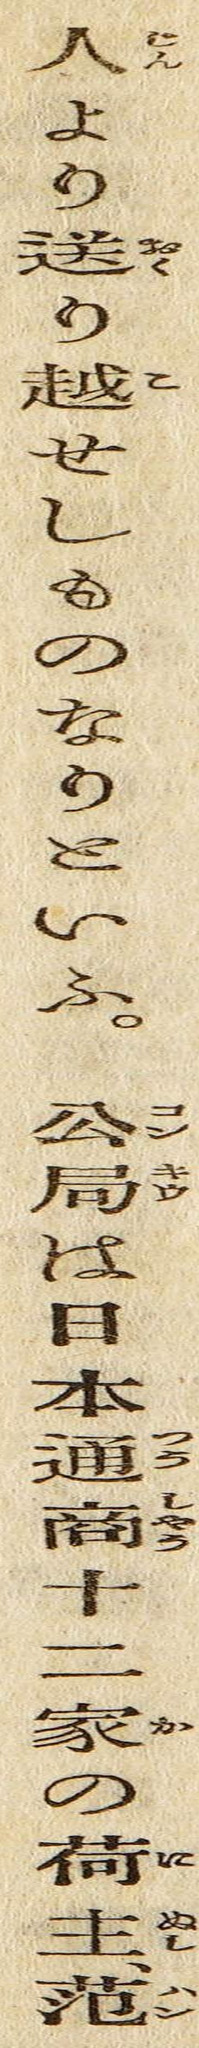人より送り越せしものなりといふ。公局は日本通商十二家の荷主、范
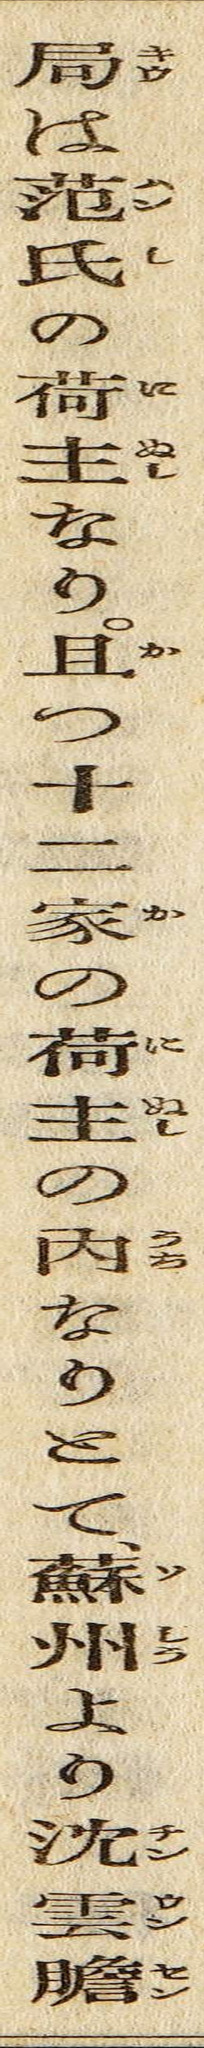局は范氏の荷主なり。且つ十二家の荷主の内なりとて、蘇州より沈雲瞻
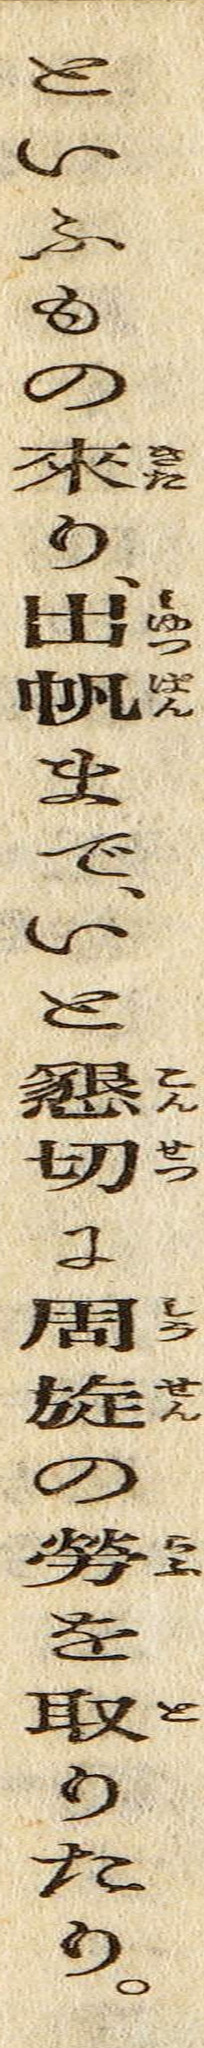といふもの來り出帆まで、いと懇切に周旋の労を取りたり。
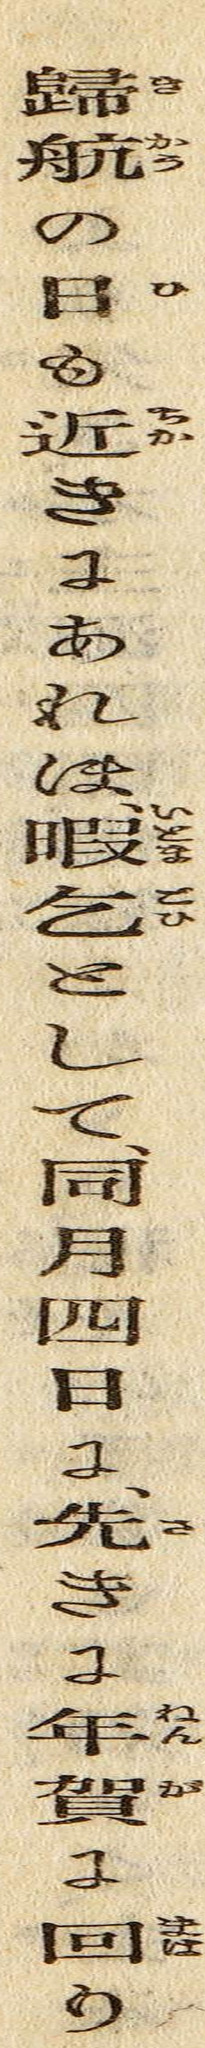帰航の日も近きにあれて、暇乞として、同月四日に、先きに年賀に回り
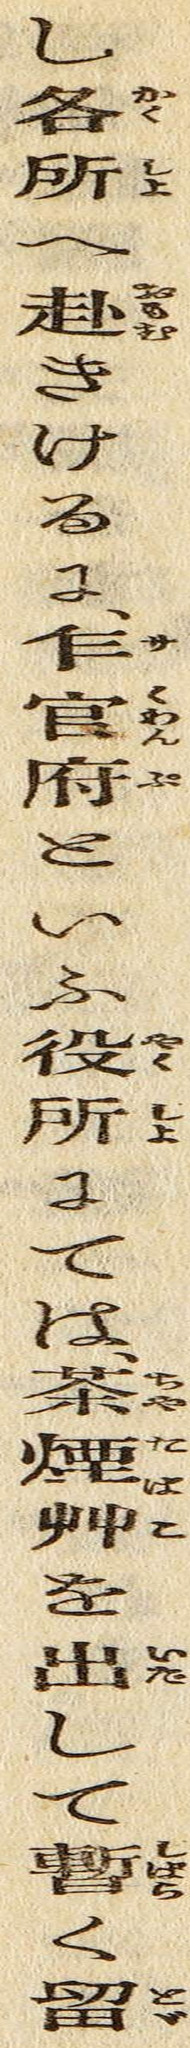し各所へ赴きけるに、乍官府とい役所にては茶煙艸を出して暫く留
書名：日本漂流譚
